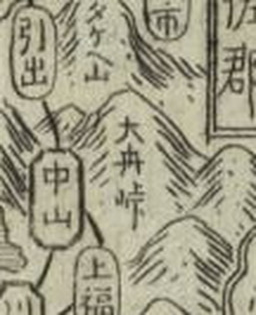大舟峠

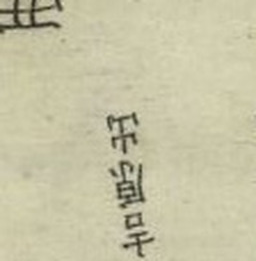吉原出
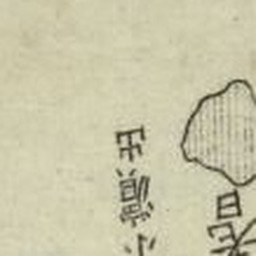小濱出
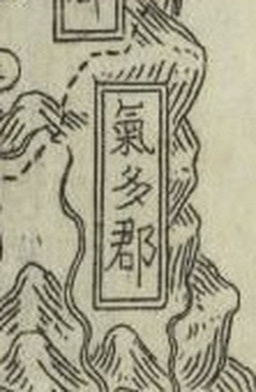氣多郡
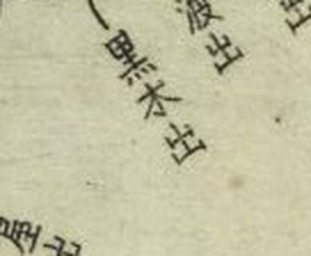黒木出
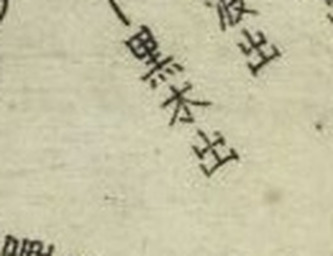黒木出
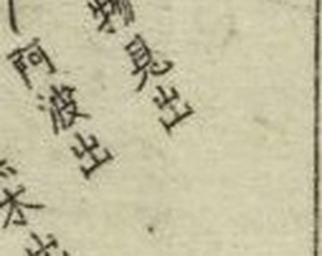物見出
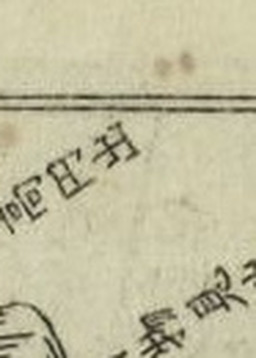高円出
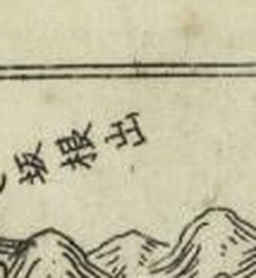坂根出
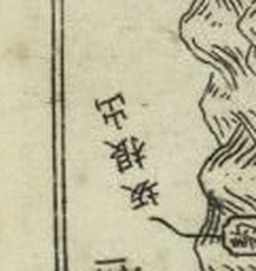坂根出
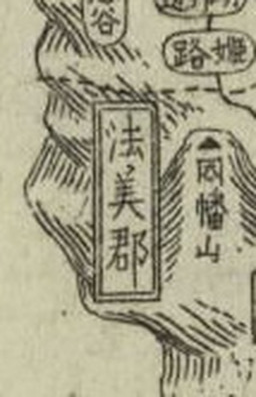法美郡
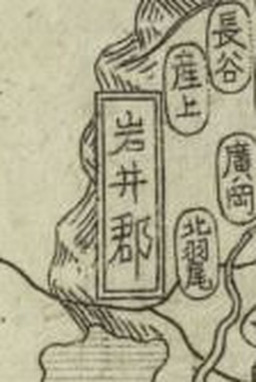岩井郡
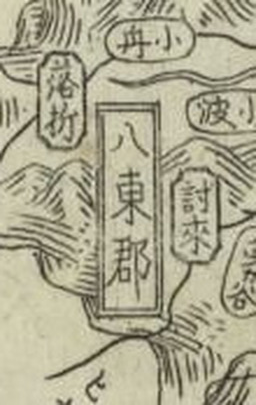八東郡

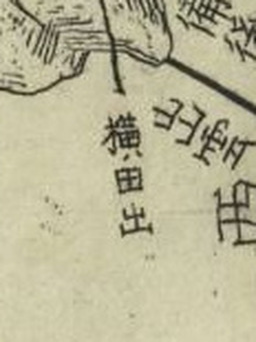横田出
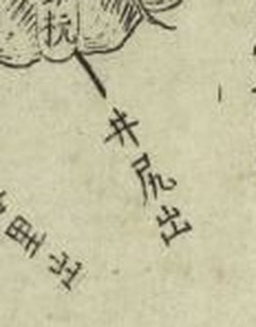井尻出
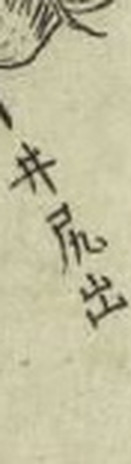井尻出
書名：大日本国細図 西国之部 下
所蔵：University of the Ryukyus Library
